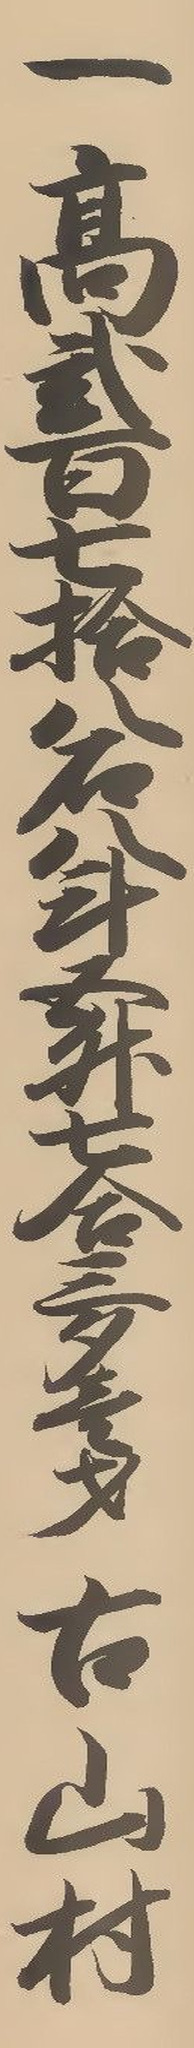一高弐百七拾八石八斗五升七合三勺壱才古山村
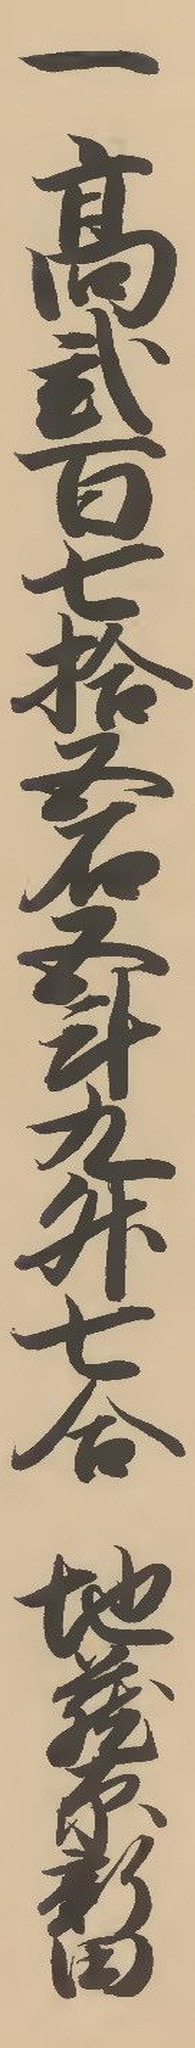一高弐百七拾五石五斗九升七合地蔵原新田
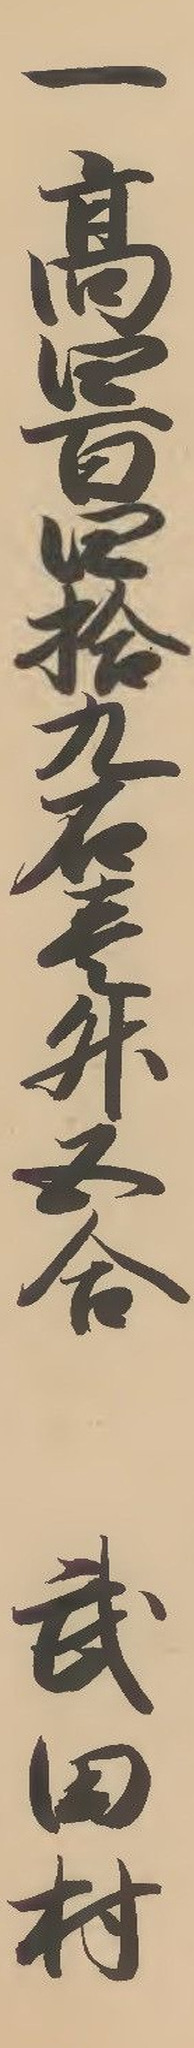一高四百四拾九石壱升五合武田村

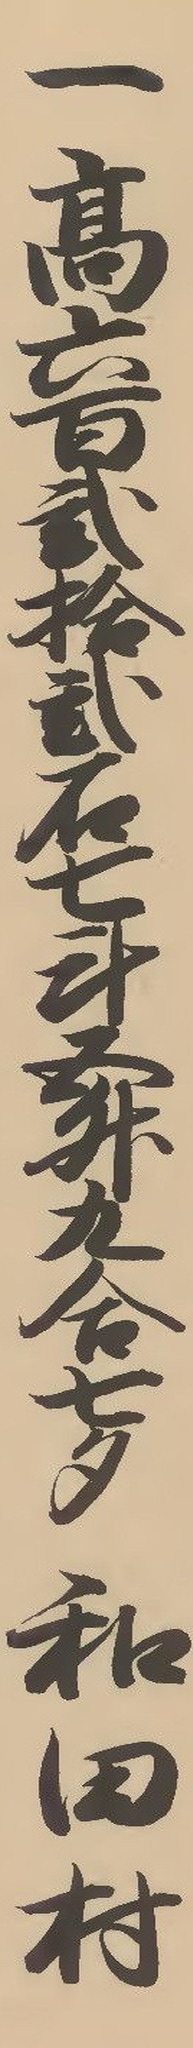一高六百弐拾弐石七斗五升九合七勺和田村
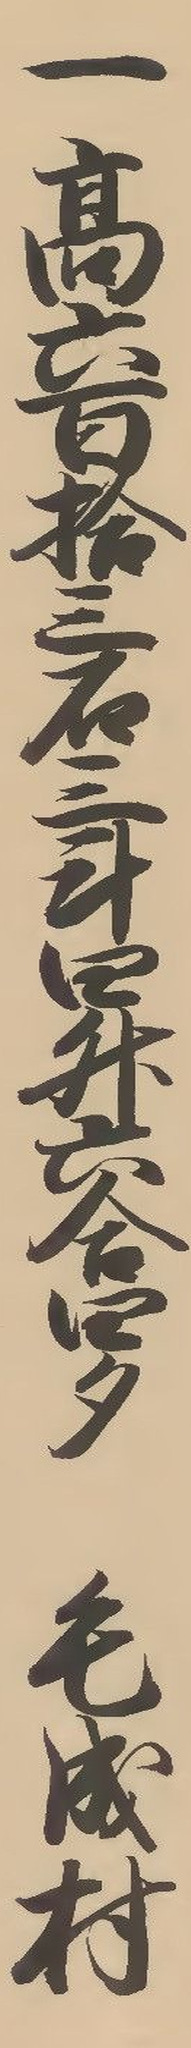一高六百拾三石三斗四升六合四勺毛成村
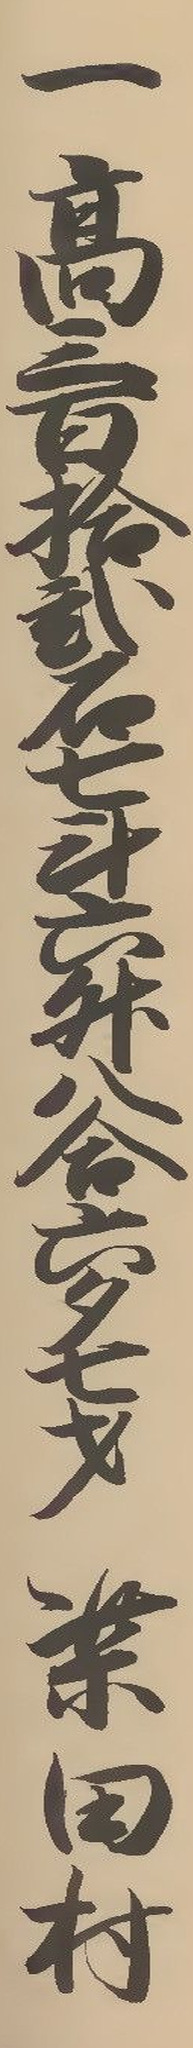一高三百拾弐石七斗六升八合六勺七才柴田村
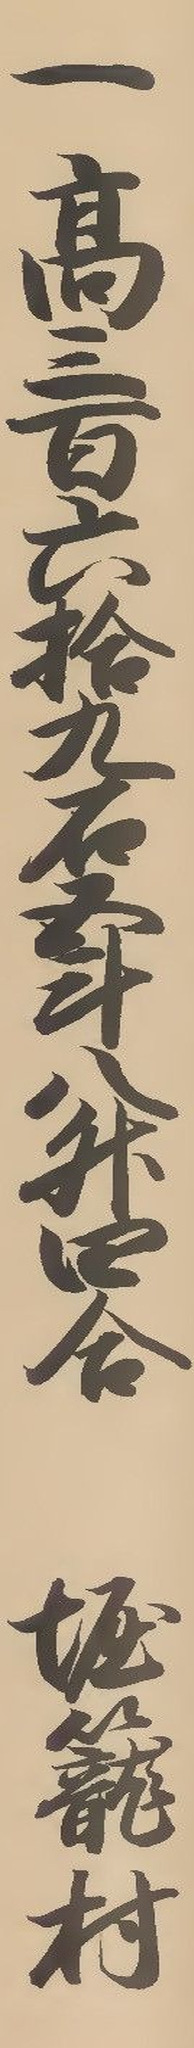一高三百六拾九石五斗八升四合堀籠村
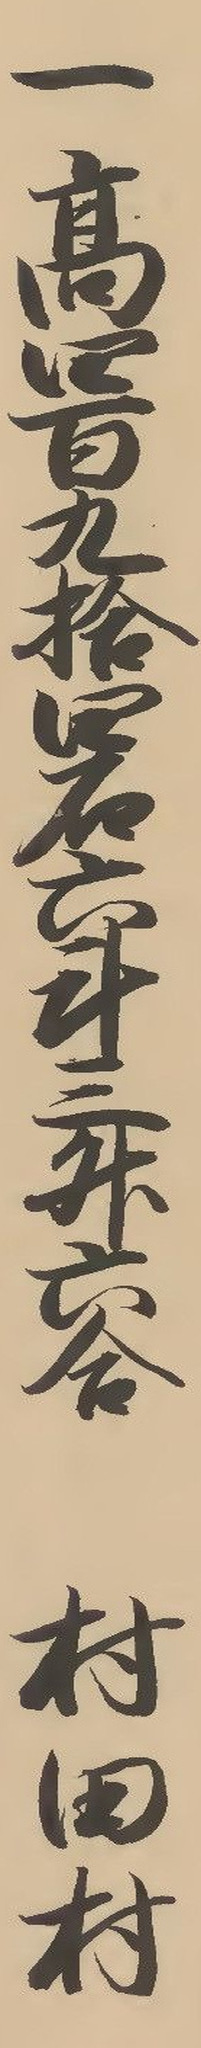一高四百九拾四石六斗三升六合村田村
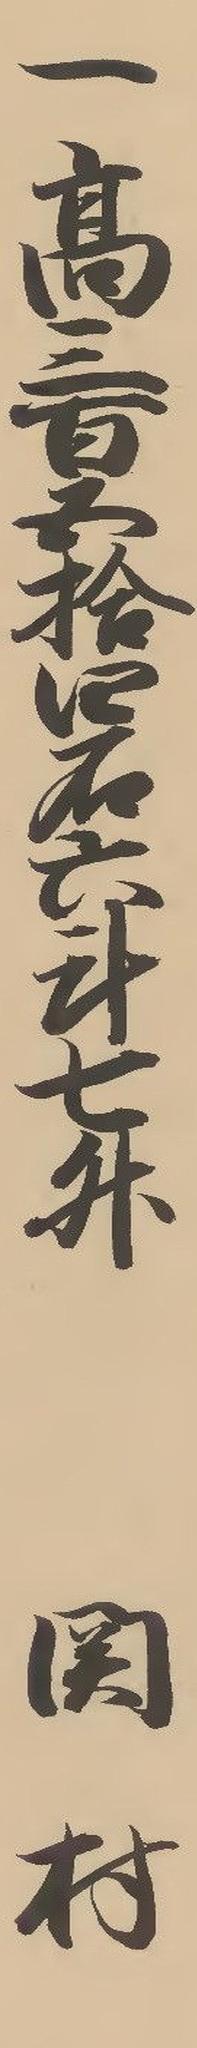一高三百五拾四石六斗七升関村

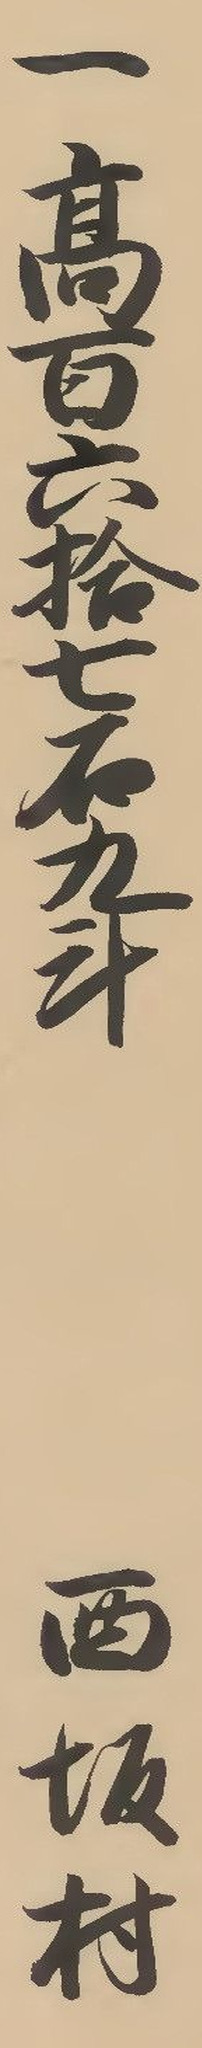一高百六拾七石九斗西坂村
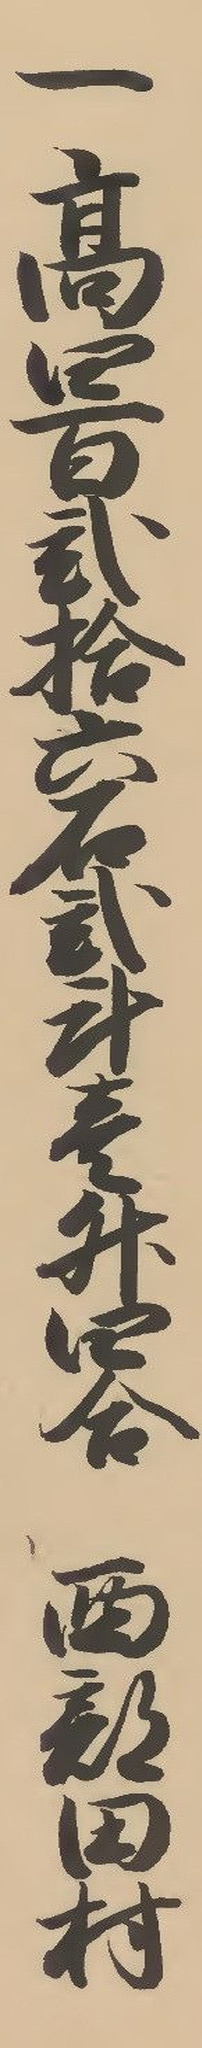一高四百弐拾六石弐斗壱升四合西部田村
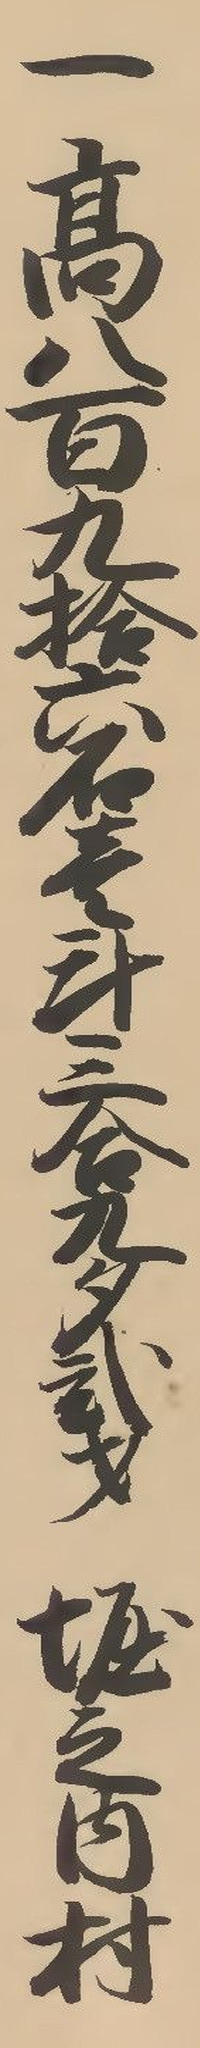一高八百九拾六石壱斗三合九勺弐才堀之内村
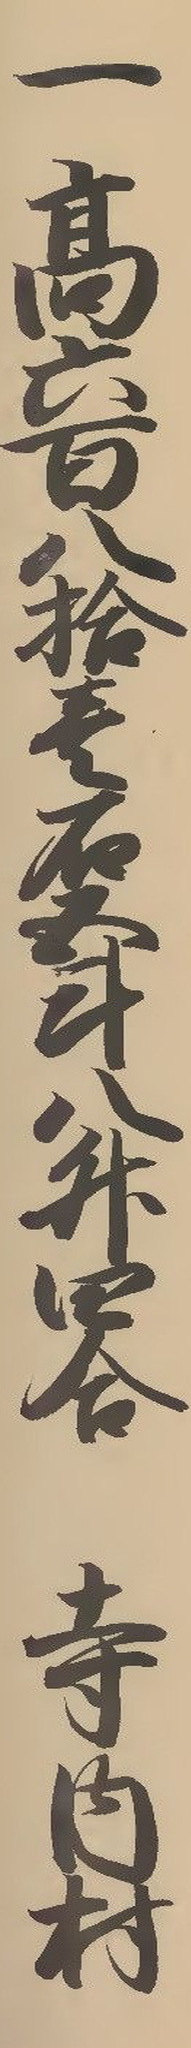一高六百八拾壱石五斗八升四合寺内村
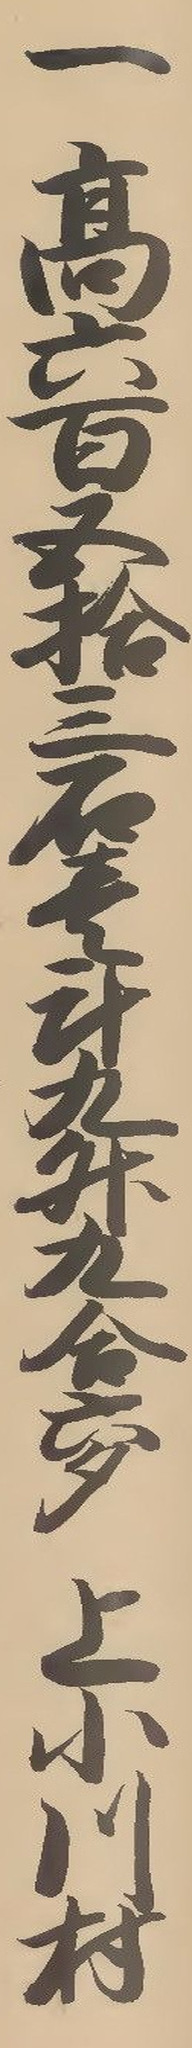一高六百五拾三石壱斗九升九合六勺上小川村
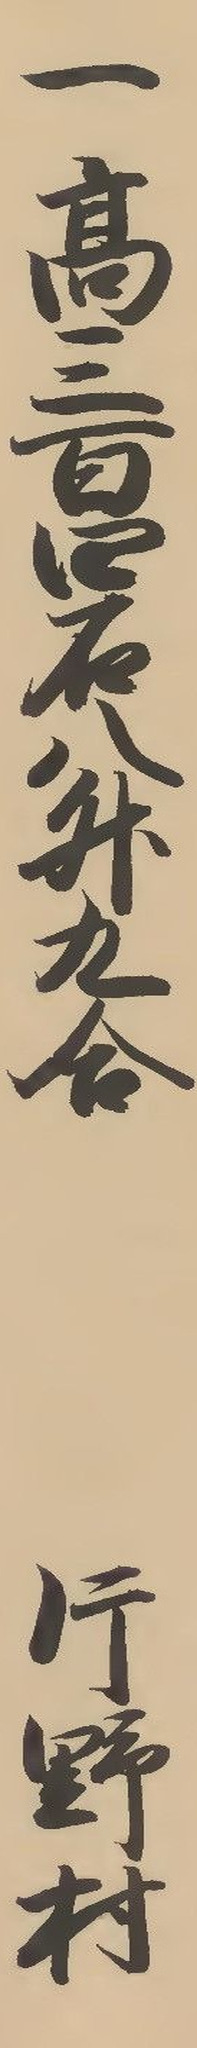一高三百四石八升九合片野村
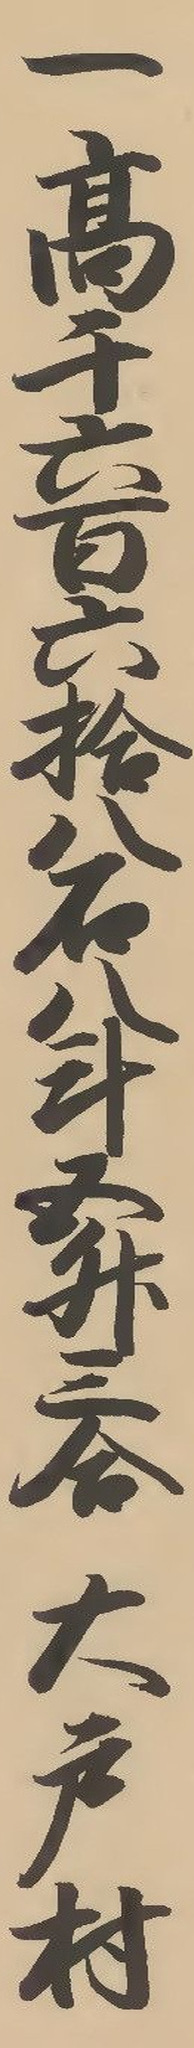一高千六百六拾八石八斗五升三合大戸村
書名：下総国郷帳
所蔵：国立公文書館 National Archives of Japan
